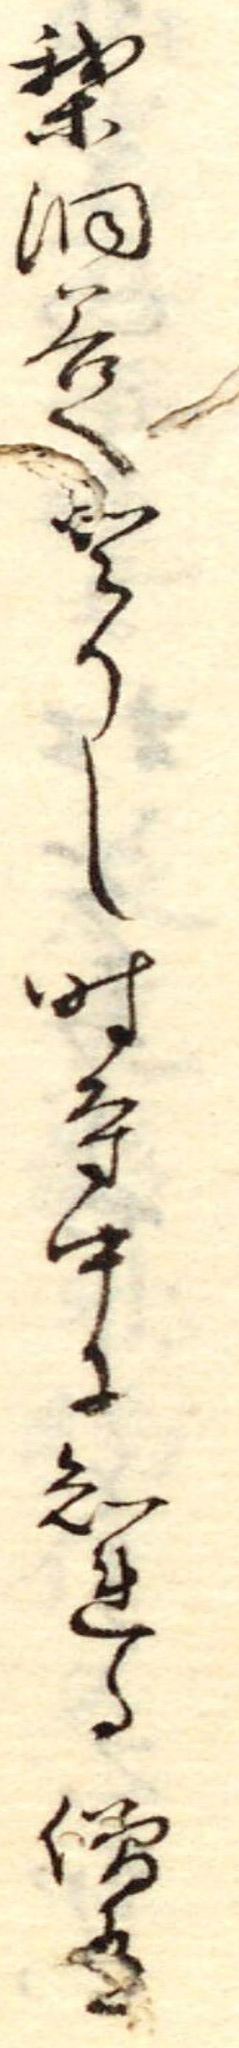我等洞谷へ登りし時寺中に知れる僧有
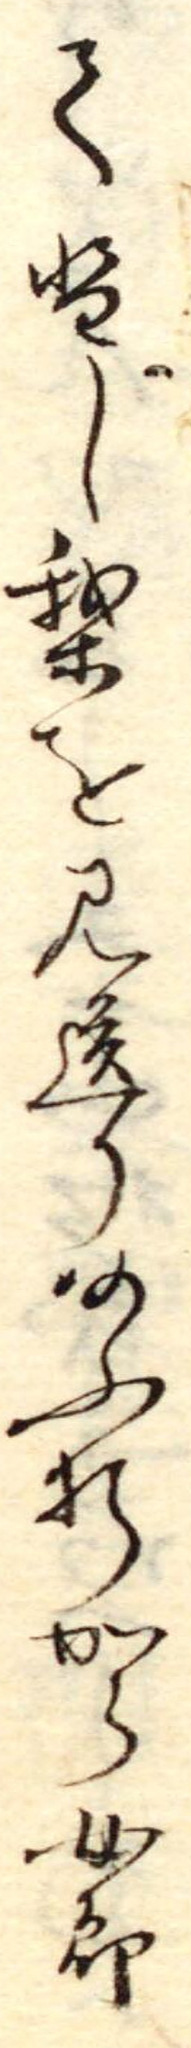て暫し我等を見送り給ふ折から女郎
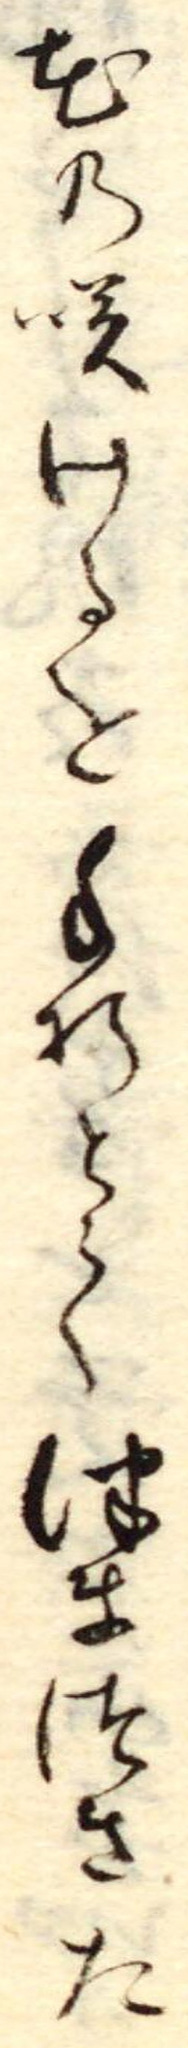花の咲けるを手折とてつまつきた
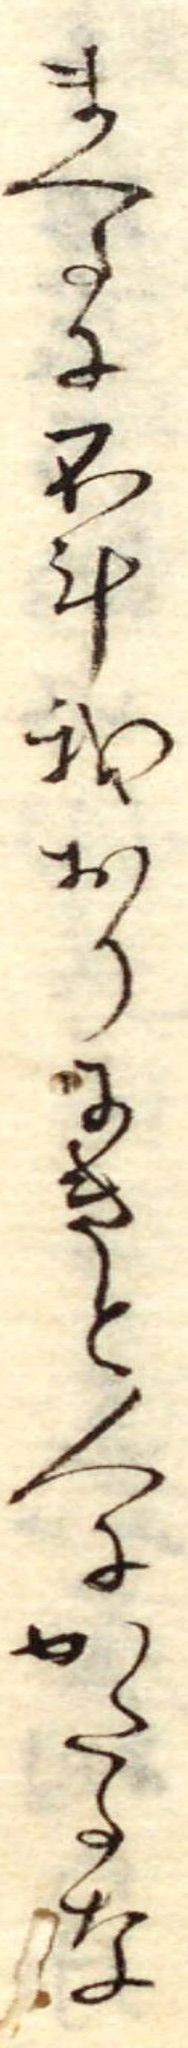まへるに不斗我おりにきと人にかた事な
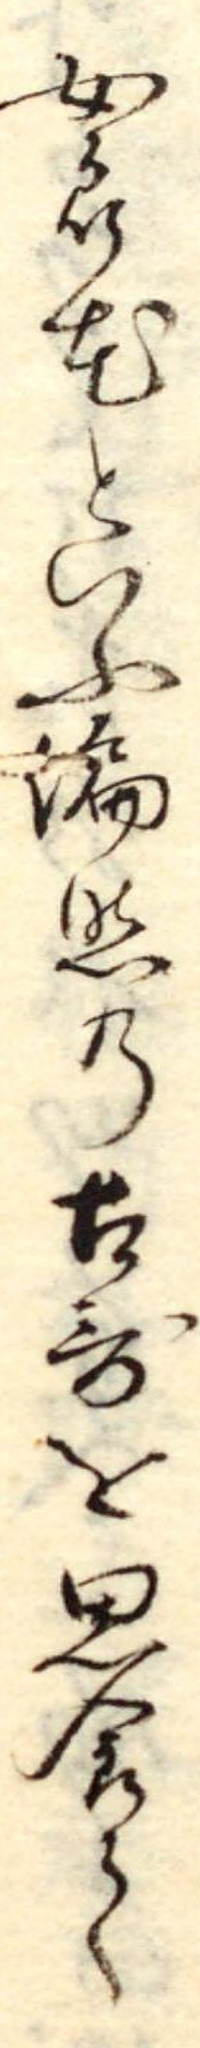女郎花といふ偏照の古哥を思食て
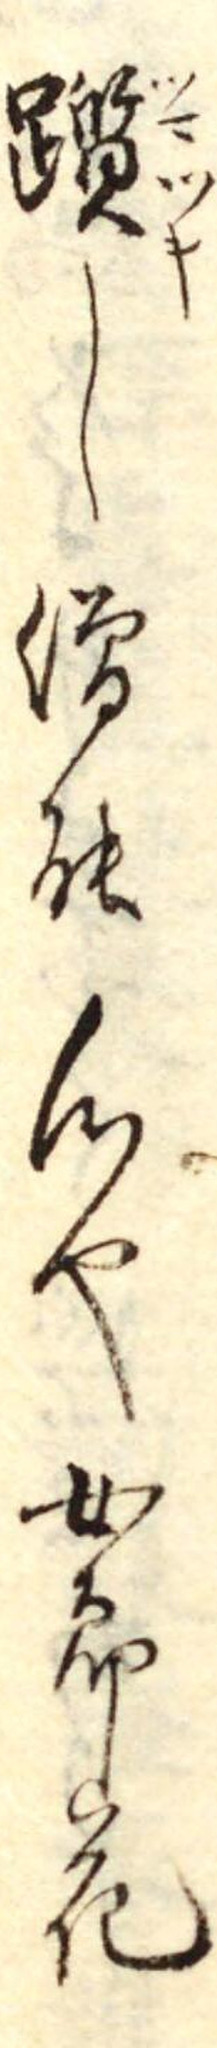躓し僧の心や女郎花
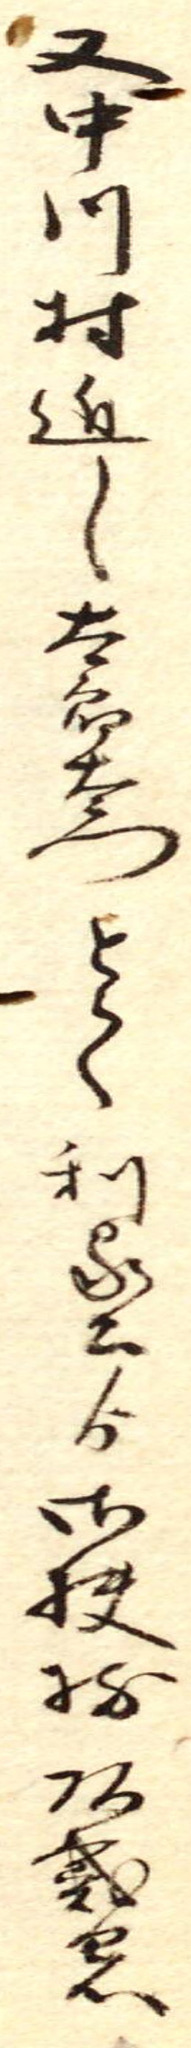又中川村近し太郎右衛門とて利家公ゟ御扶持頂戴の
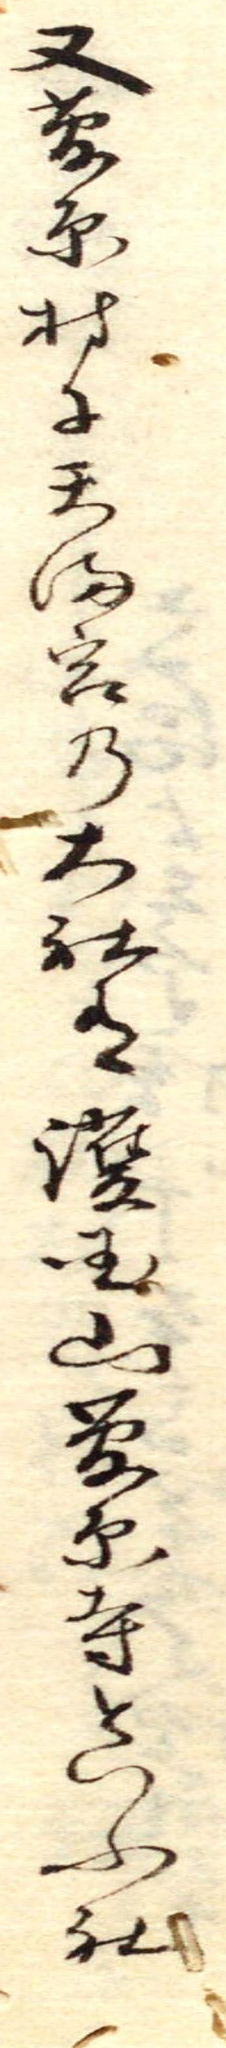又菅原村に天満宮の大社有護国山菅原寺といふ社
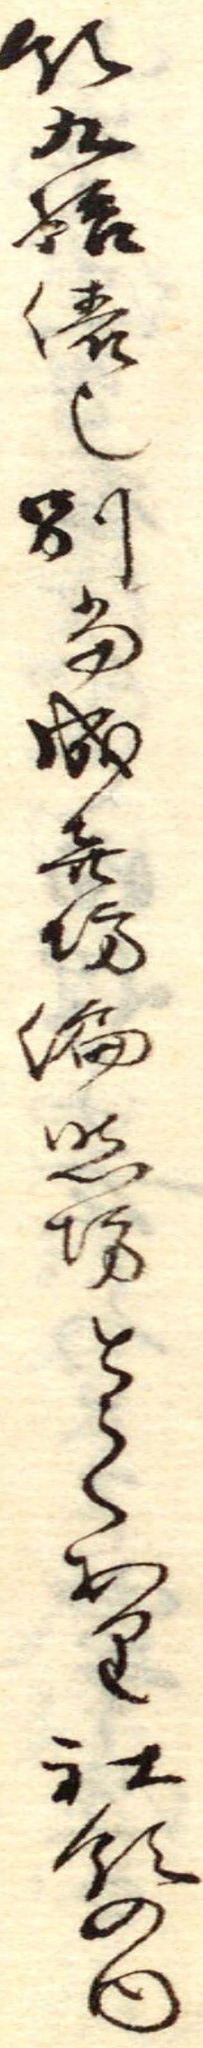領九拾俵也別当成喜坊偏照坊とてあり社領の内
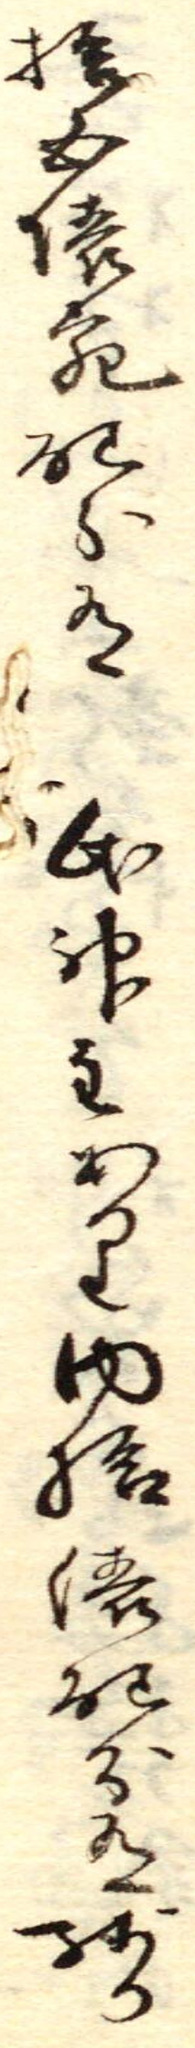拾五俵宛配分有氏神主あり内拾俵配分有残り
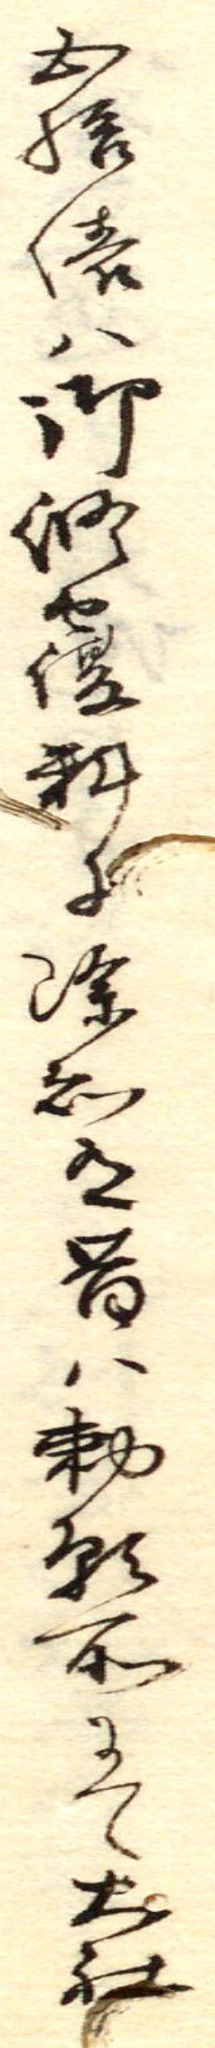五拾俵は御修覆料に除知有昔は勅願所にて大社
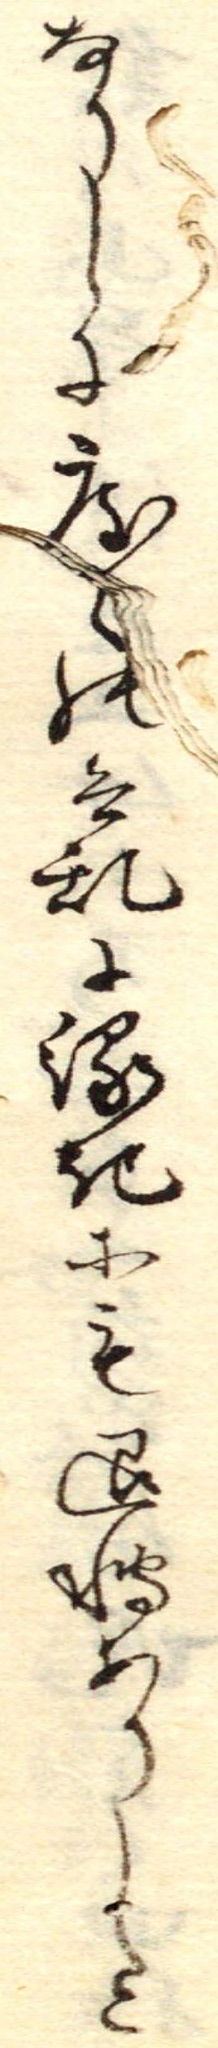なりしに度々の兵乱に縁起等も退転ありしと
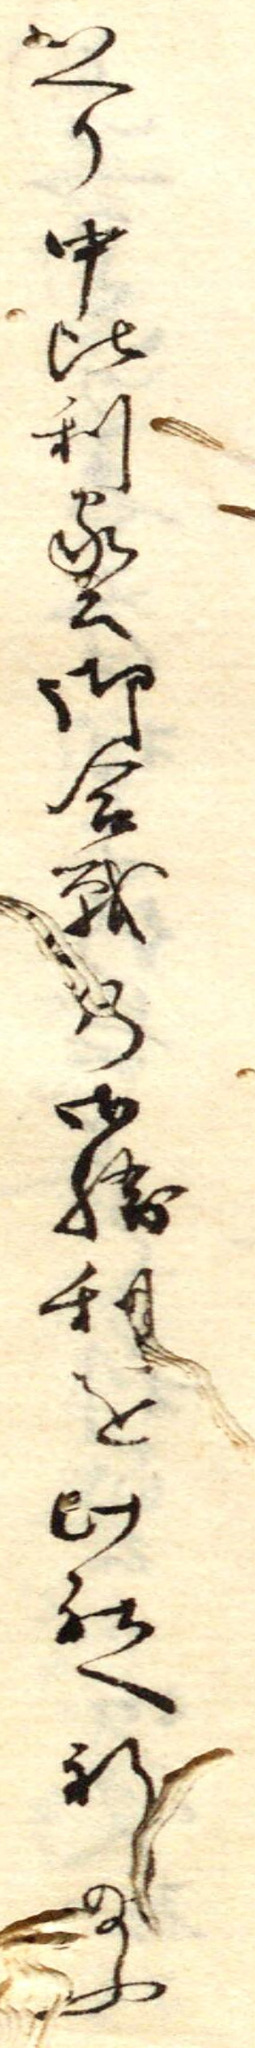いへり中比利家公御合戦の御勝利を此社へ祈し給ふ
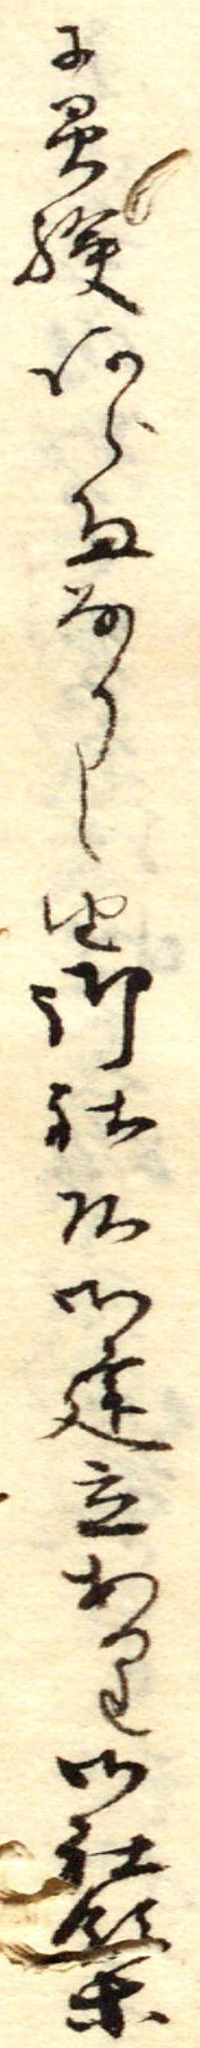に霊験あらたなりし由御社頭御建立あり御社領等

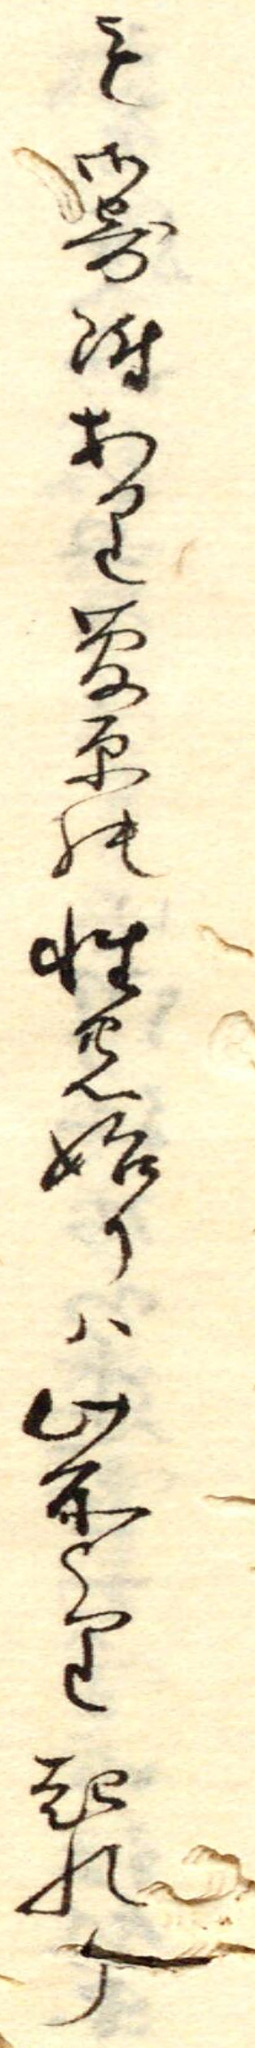も御寄附あり菅原の性の始りは此所より起れり
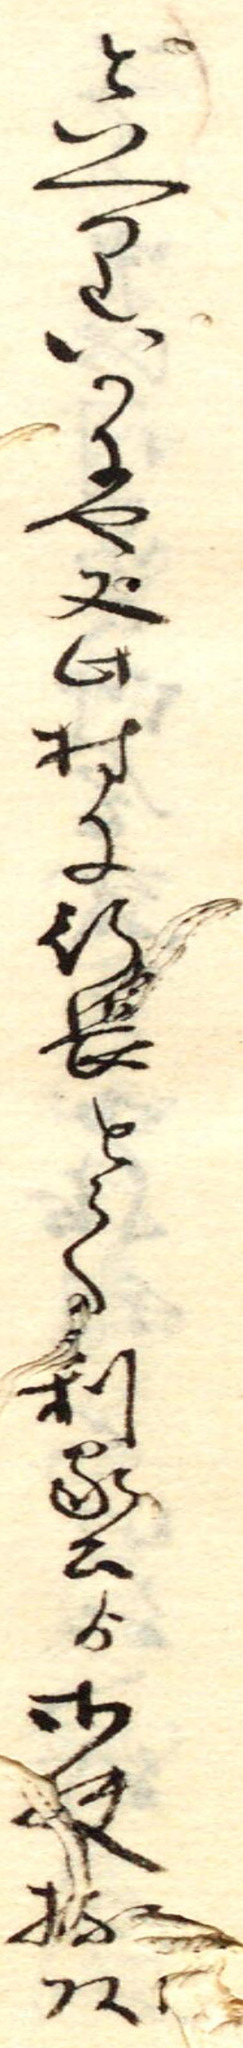といへりいかにや又此村に行長とて利家公ゟ御扶持頂
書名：能登名跡誌
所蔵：Ishikawa Prefectural Library
